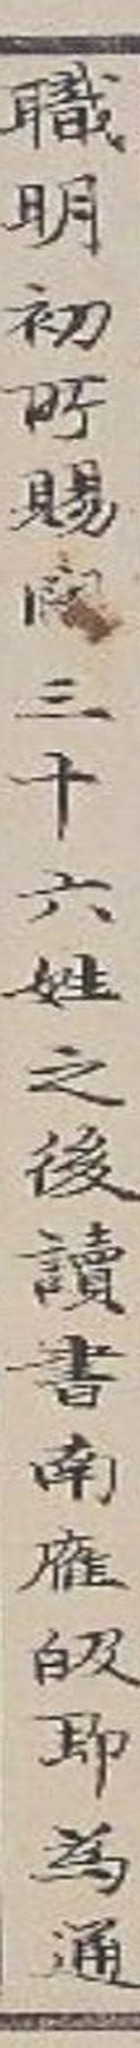職明初所賜閩三十六姓之後読書南即為通
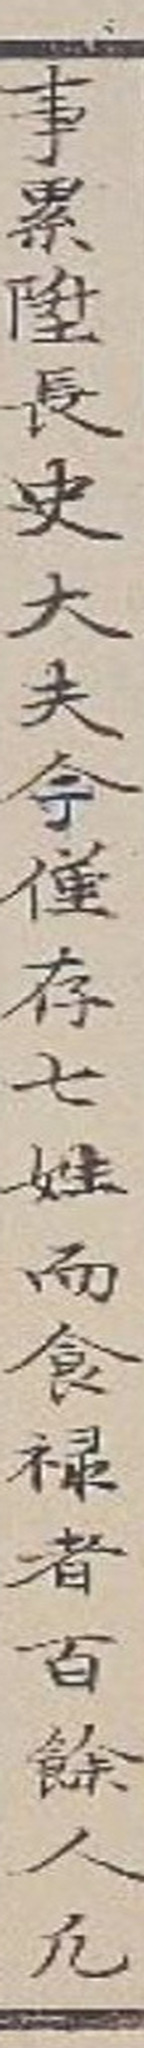事累陞長史大夫今僅存七姓而食禄者百余人凡
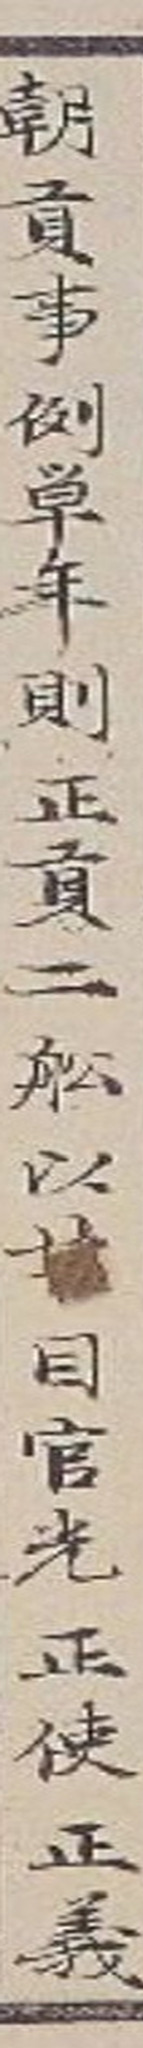朝貢事例単年則正貢二船以目官光正使正義
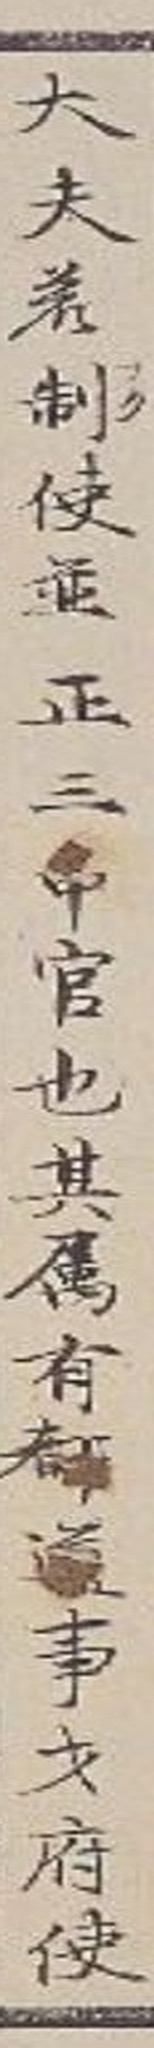大夫着制使並正三官也其属有都通事才府使
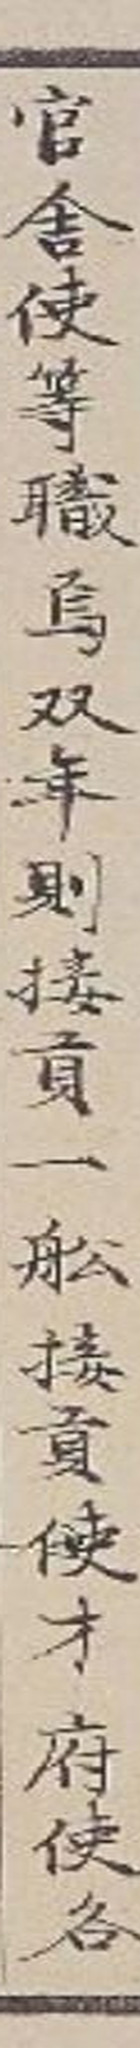官舎使等職焉双年則接貢一船接貢使才府使各
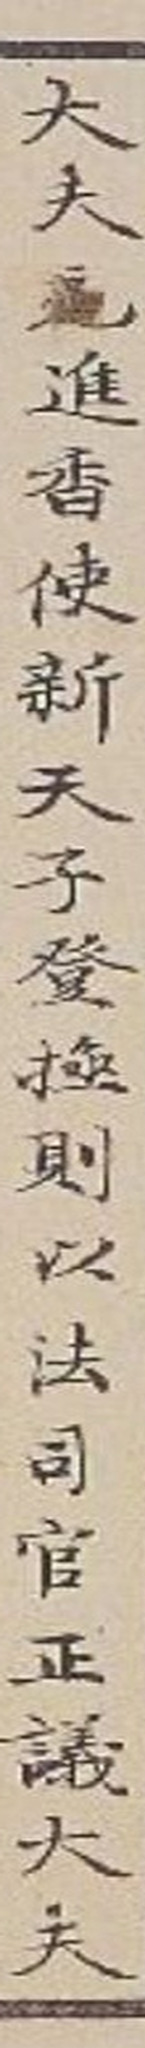大夫進香使新天子登極則以法司官正議大夫
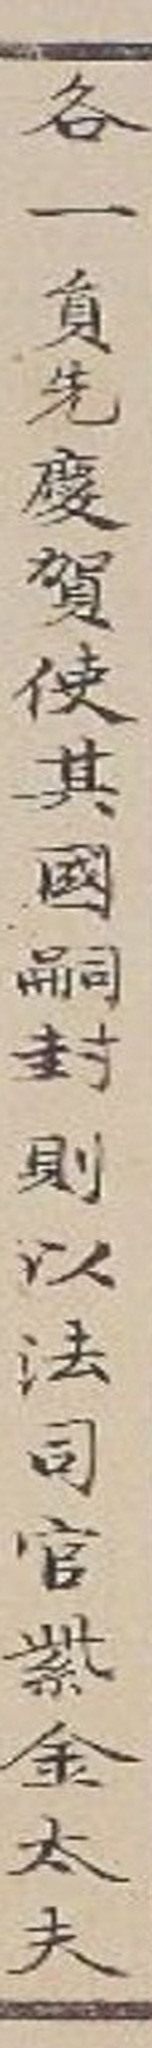各一員先慶賀使其国嗣封則以法司官紫金太夫
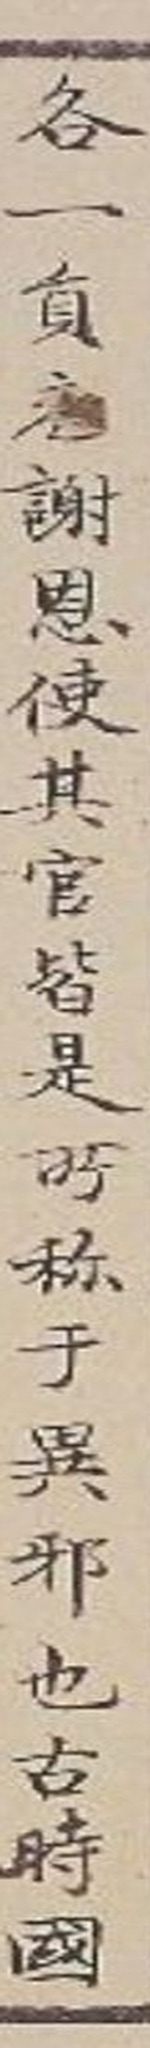各一員充謝恩使其官皆是所称于異邪也古時国
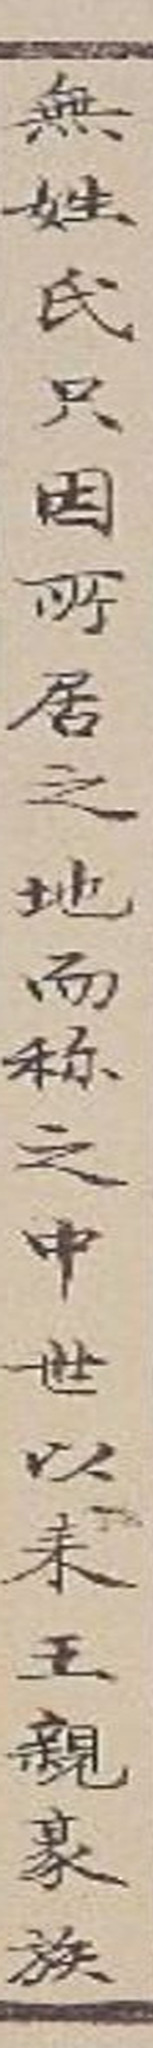無姓氏只因所居之地而称之中世以来王親豪族
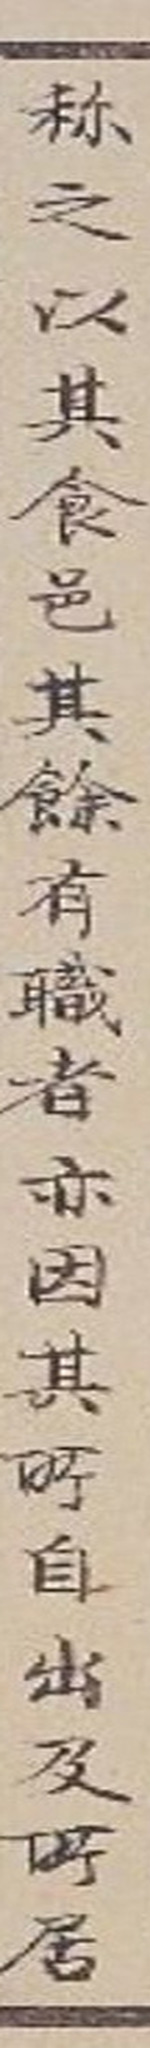称之以其食邑其余有職者亦因其所自出及所居
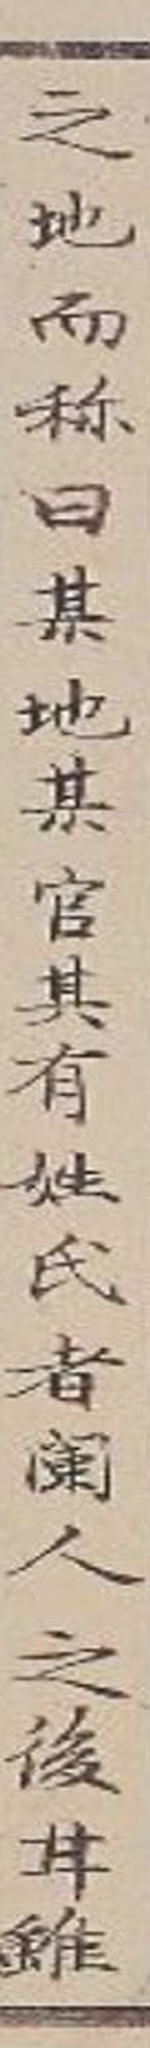之地而称曰某地某官其有姓氏者閩人之後雖
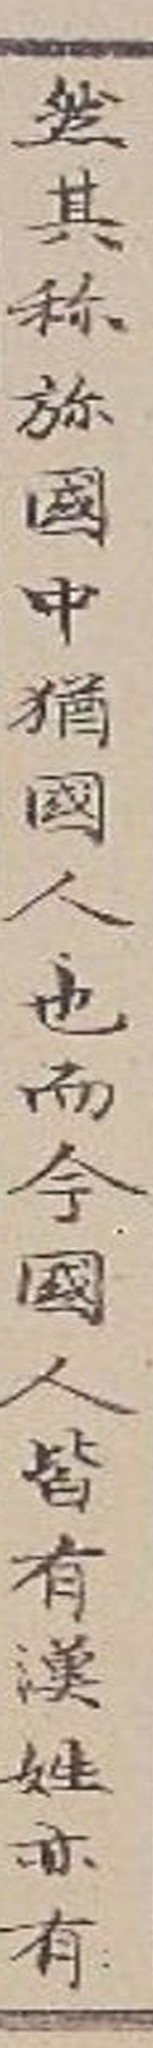然其称国中猶国人也而今国人皆有漢姓亦有

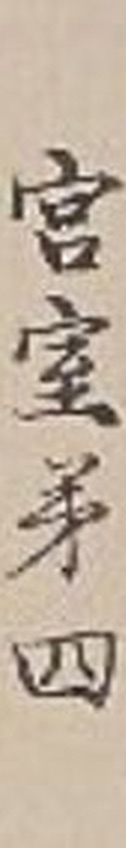宮室第四
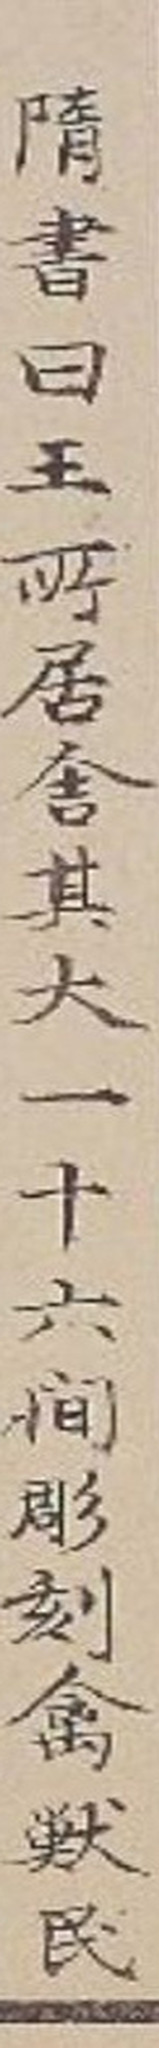隋書曰王所居舎其大一十六間彫刻禽獣民
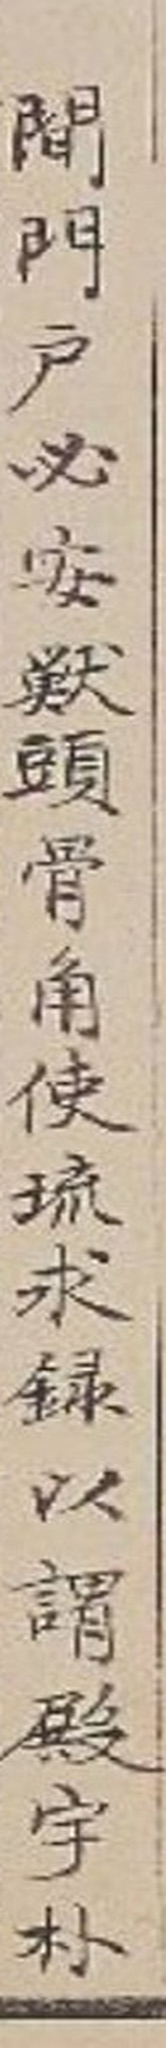間門戸必安獣頭骨角使琉求録以謂殿宇朴
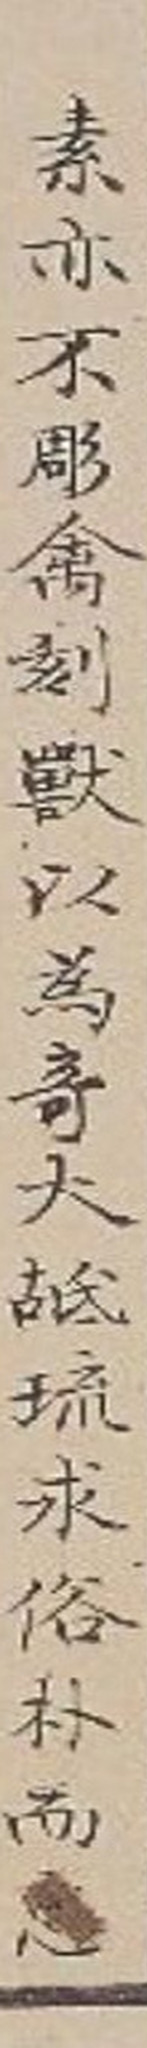素亦不彫禽刻獣以為奇大琉求俗朴而忠
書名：南島志 全
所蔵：University of the Ryukyus Library
